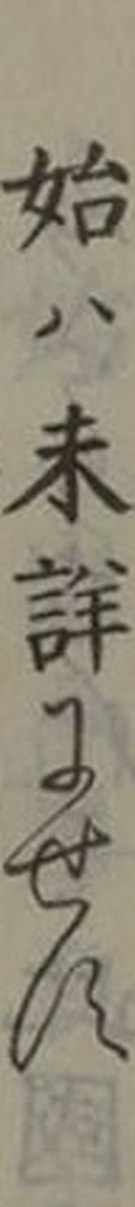始は未詳にせす
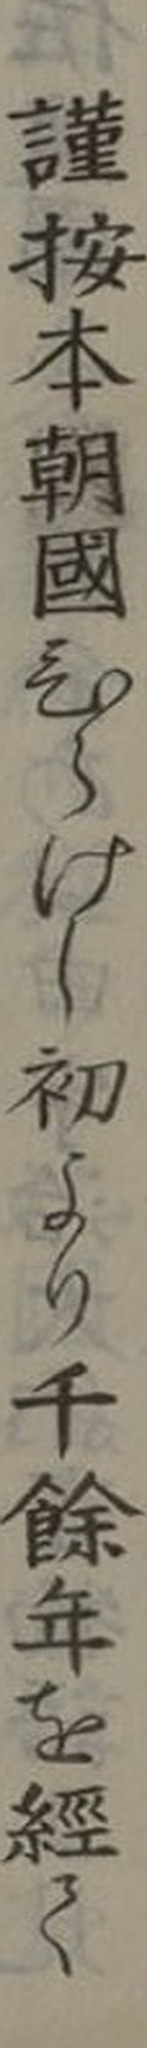謹按本朝國ひらけし初より千餘年を經て
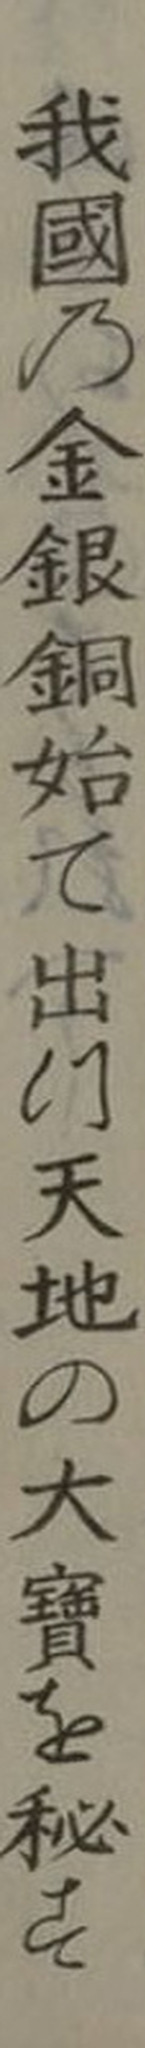我國の金銀銅始て出て天地の大寶を秘す
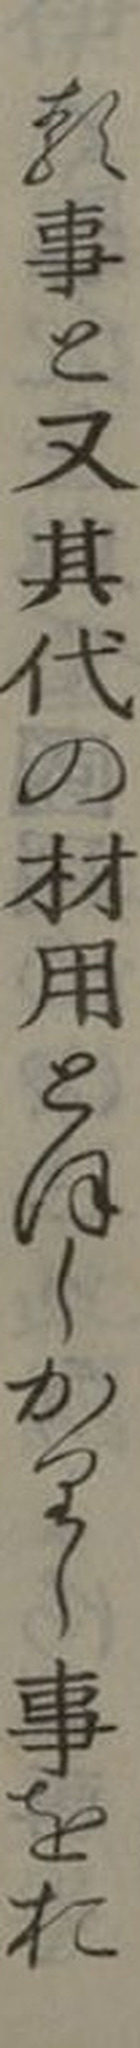る事と又其代の材用とほしかりし事をお
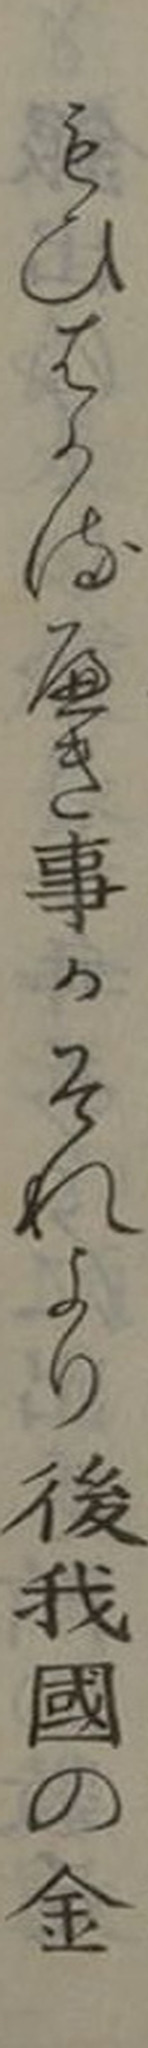もひはかるへき事かそれより後我國の金

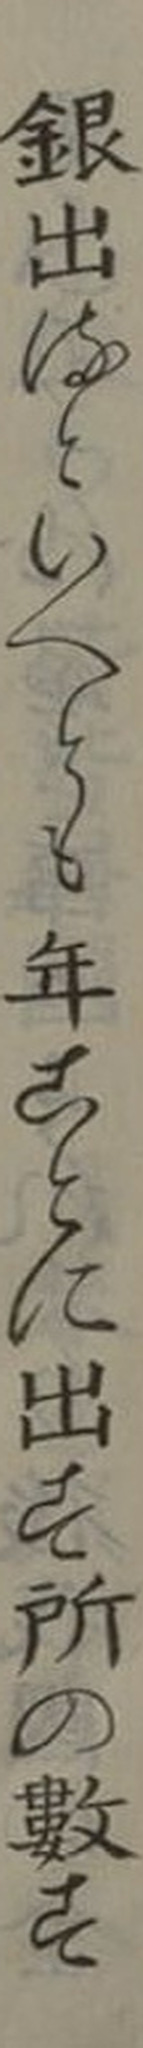銀出すといへとも年ことに出す所の數す
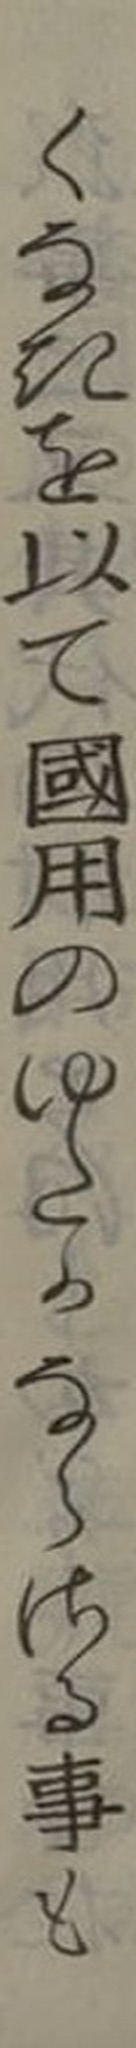くなきを以て國用のゆたかならさる事も
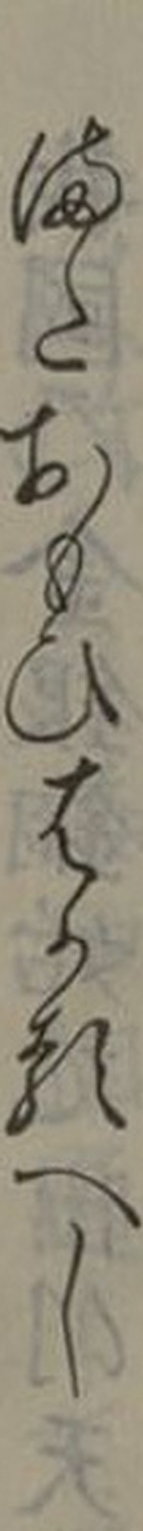またおもひはかるへし
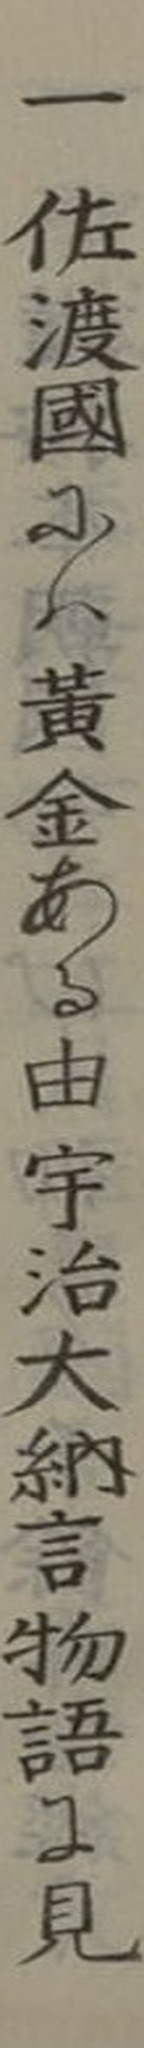一佐渡國には黃金ある由宇治大納言物語に見
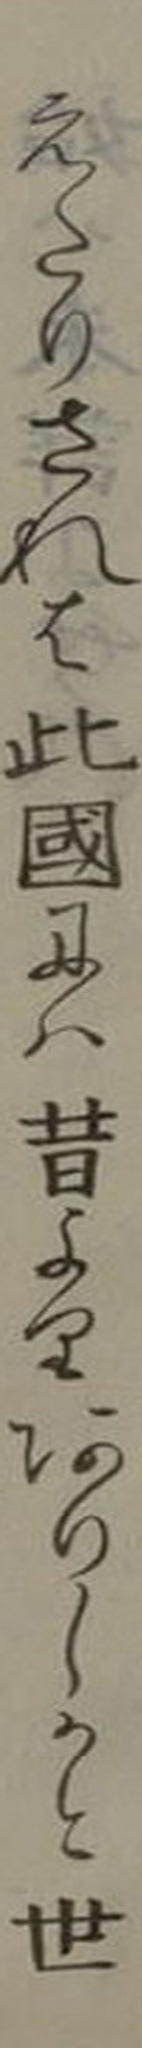えたりされは此國には昔よりありしかと世
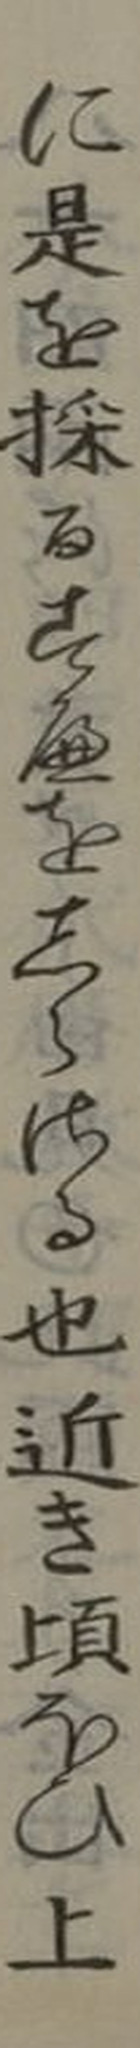に是を採るすへをしらさる也近き頃ほひ上
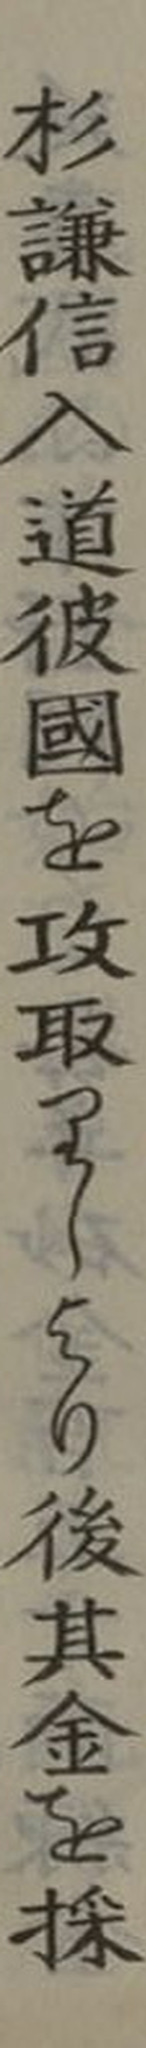杉謙信入道彼國を攻取りしより後其金を採
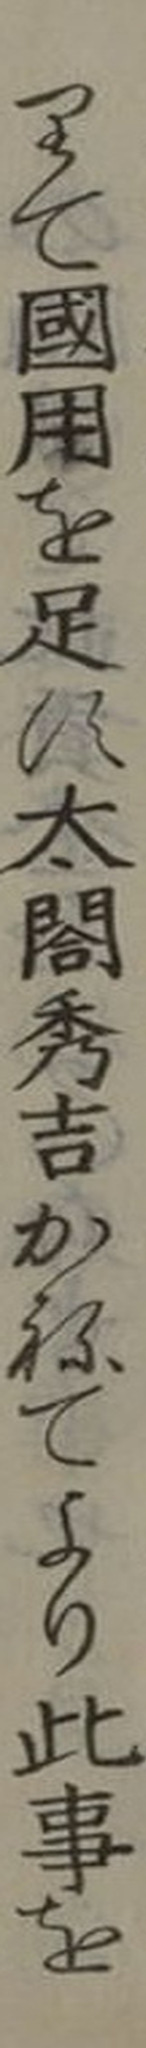りて國用を足す太閤秀吉かねてより此事を
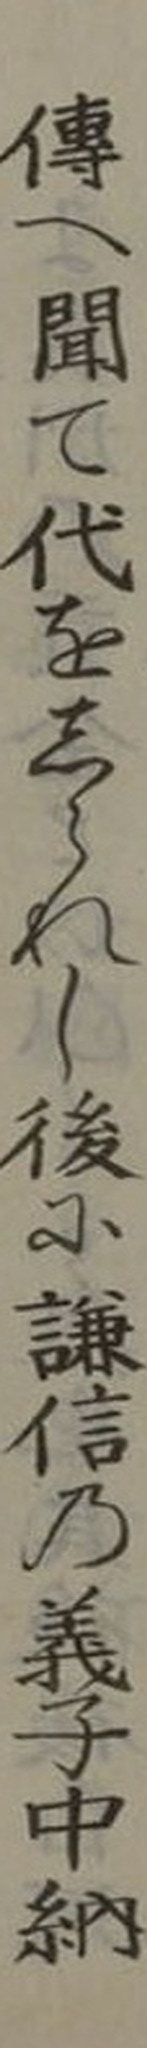傳へ聞て代をしられし後に謙信の義子中納
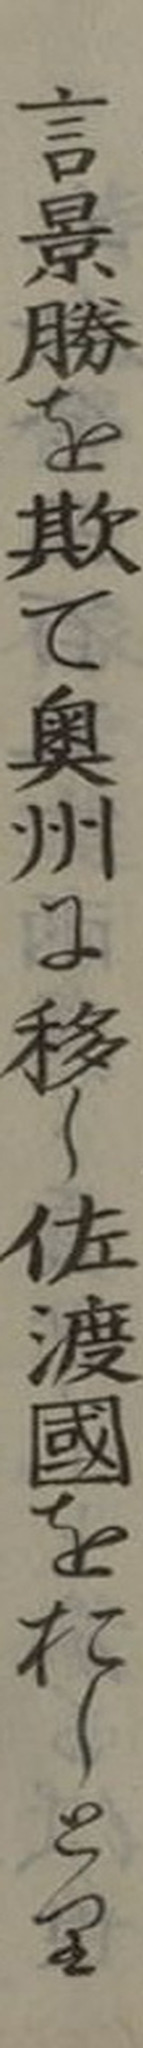言景勝を欺て奧州に移し佐渡國をおしとり
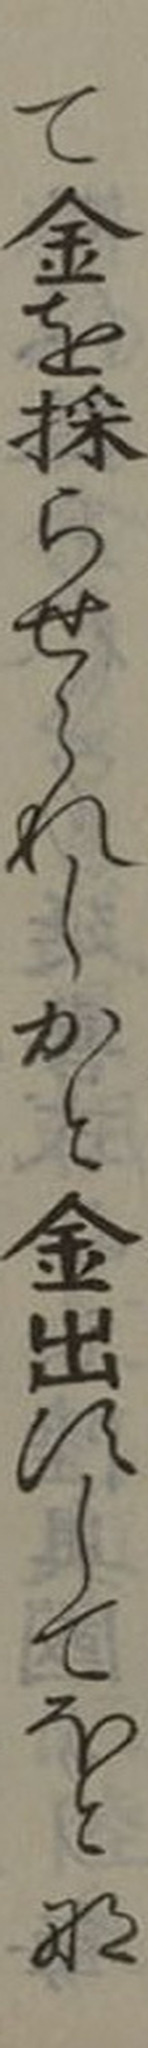て金を採らせられしかと金出すしてほとな
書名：骨董録
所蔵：University of the Ryukyus Library
